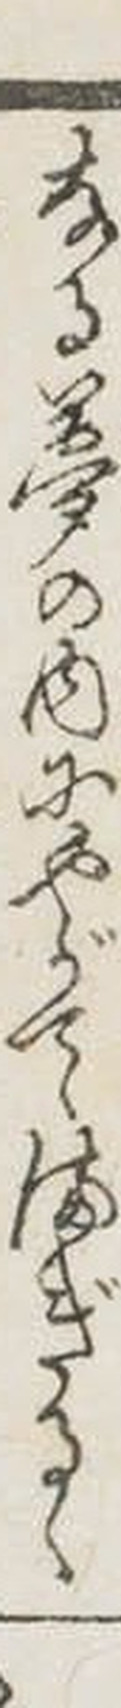なる夢の内にやがてまぎるゝ
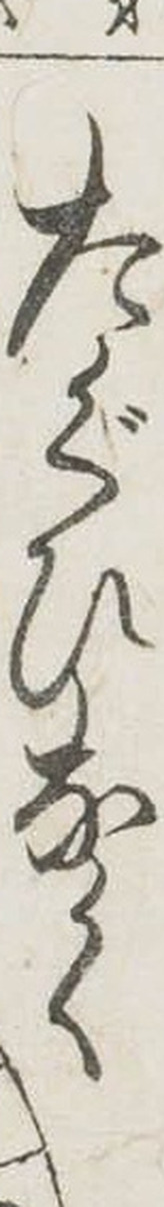たぐひなく
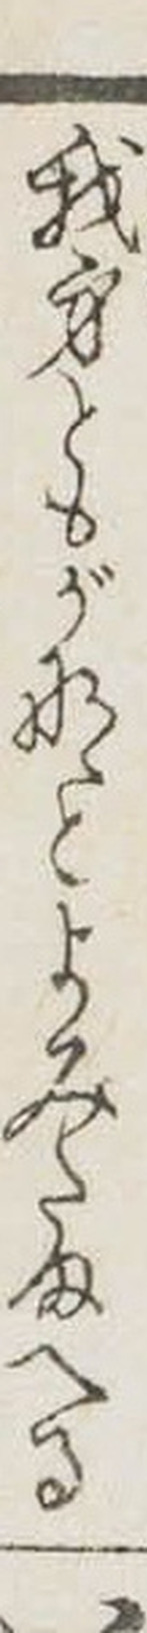我身ともがなとよみたまへる
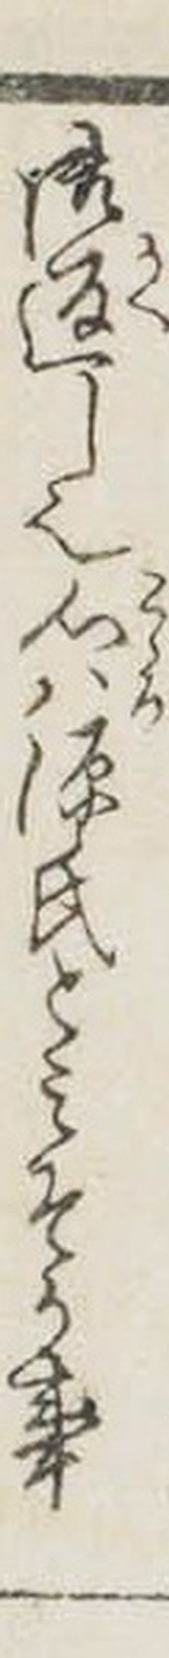御返し也心は源氏とみそか事
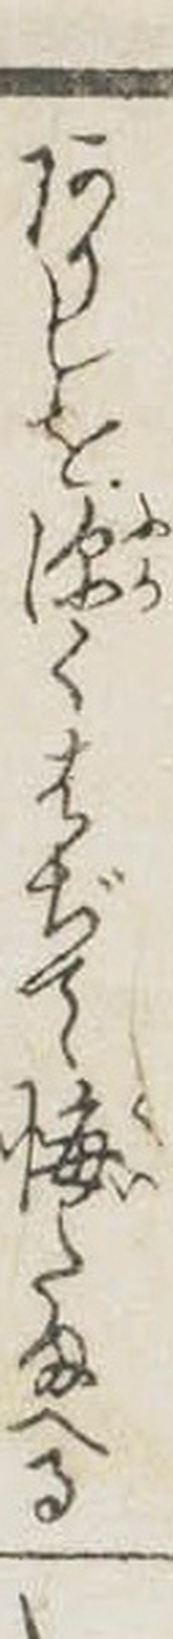ありしを深くはぢて悔たまへる
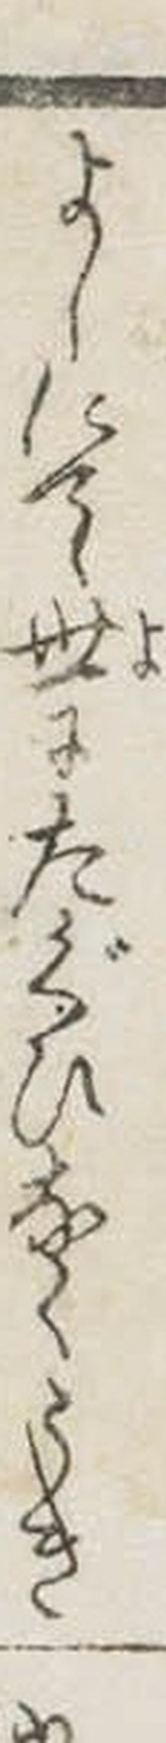よしにて世にたぐひなくうき
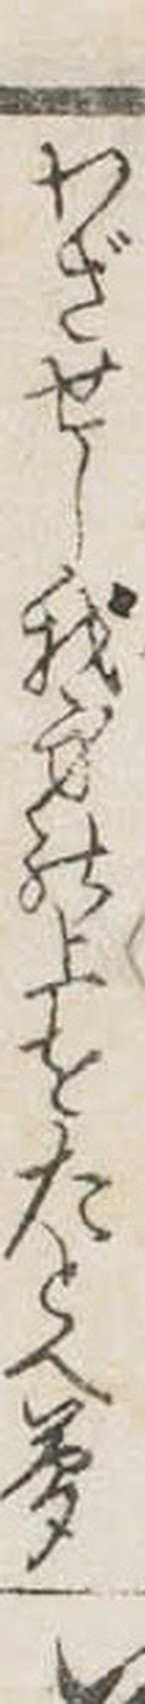わざせし我身の上をたとへ夢
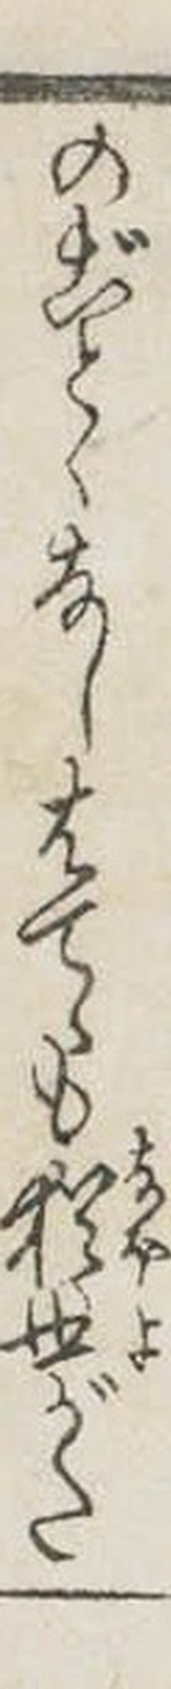のごとくなしはてゝも猶世がた
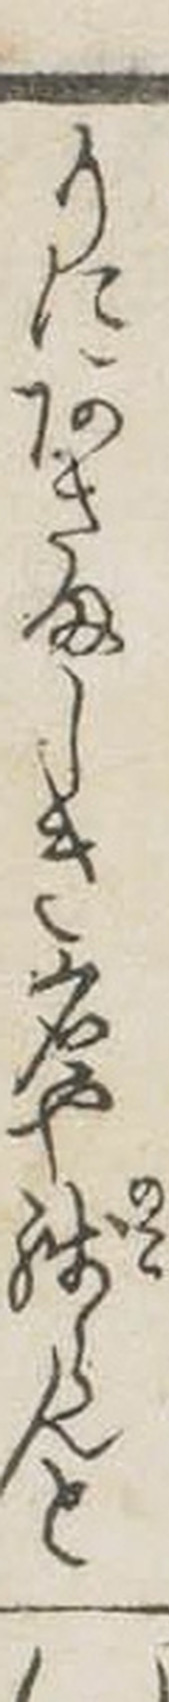りにあさましき名や残らんと

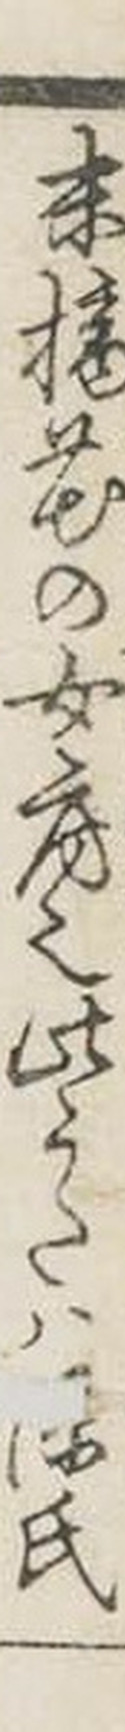末摘花の女房也此うたは源氏
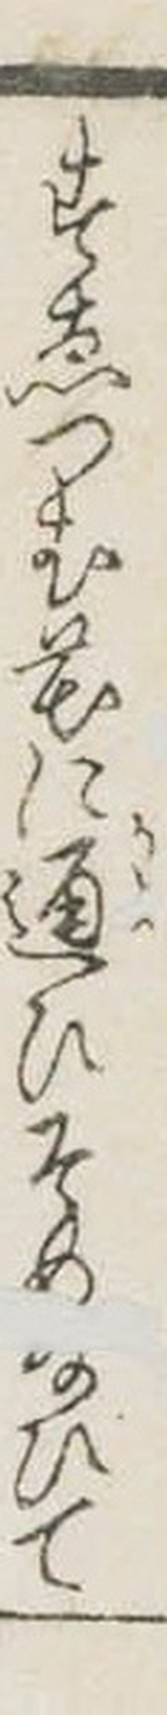すゑつむ花に通ひそめ給ひて
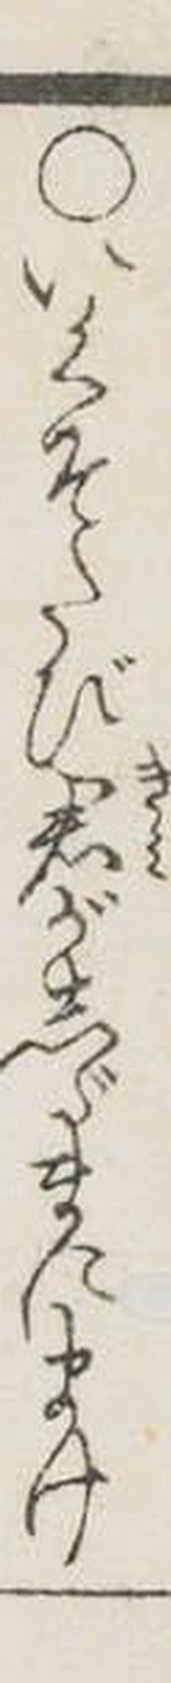○いくそたび君がしゞまにまけ
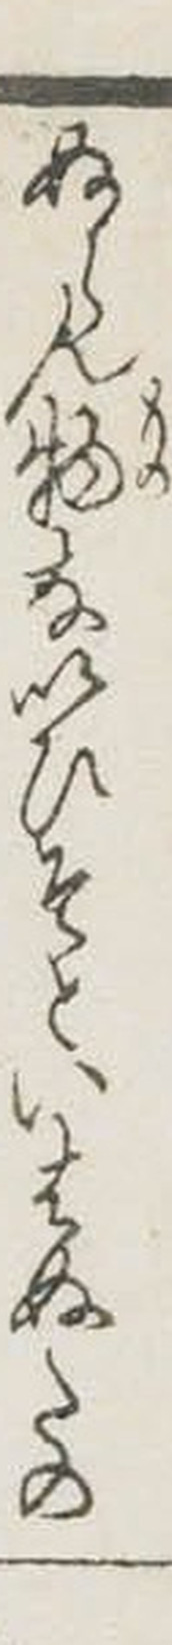ぬらん物ないひそといはぬこの
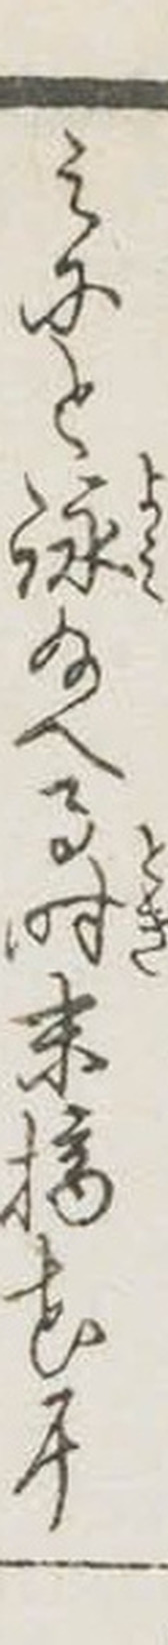みにと詠給へる時末摘花に
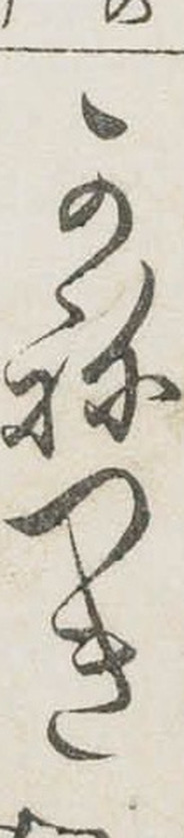かねつき
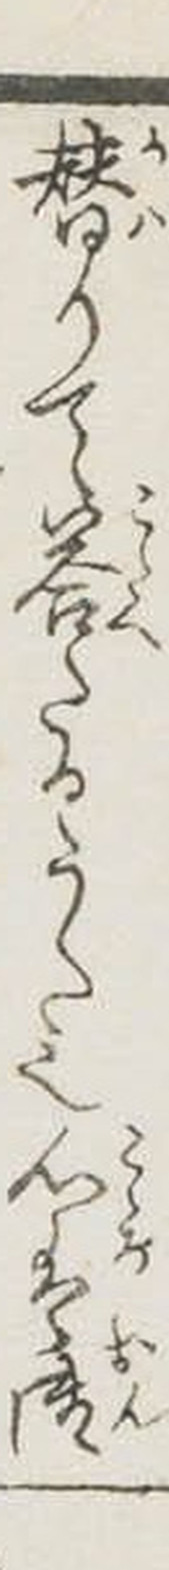替りて答たるうた也心は御
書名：源氏百人一首
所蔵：東京学芸大学教育コンテンツアーカイブ
